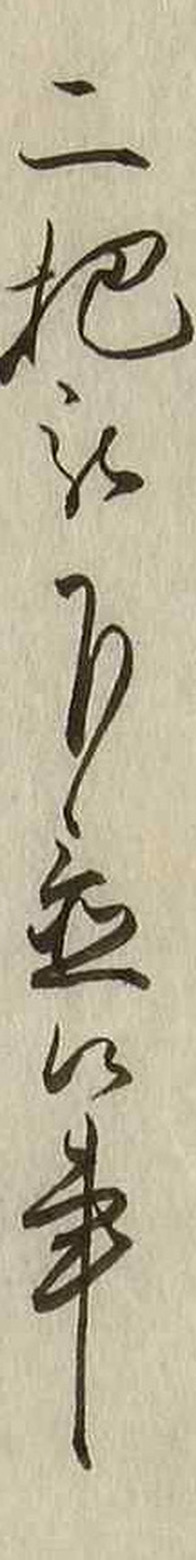二把被下置侯事
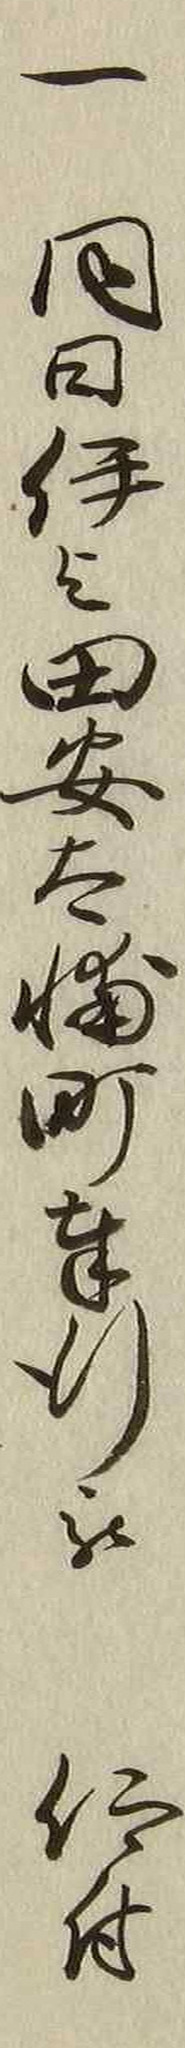一同日伊与田安太輔町奉行被仰付
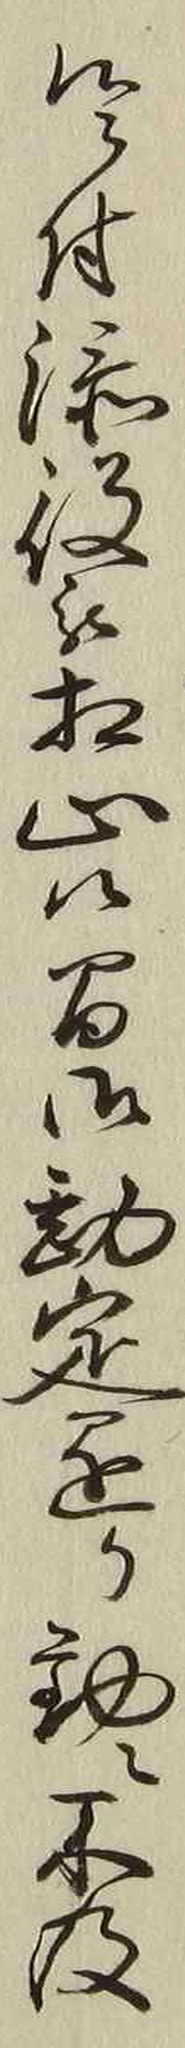候ニ付添役被相止候間御勘定懸り勤ニ不及
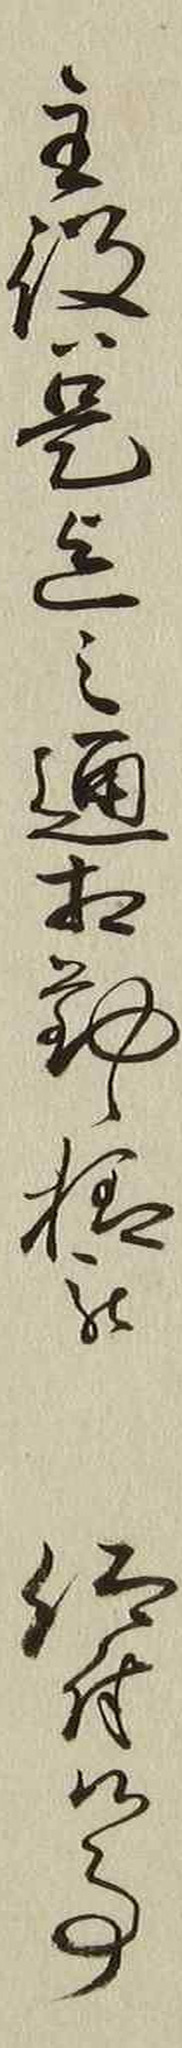主役ハ是迄之通相勤候様被仰付候事
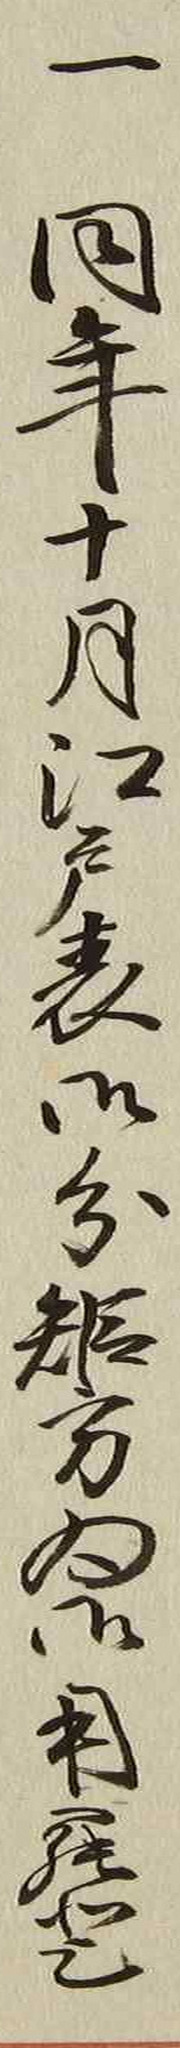一同年十月江戸表御分矩方為御用罷登
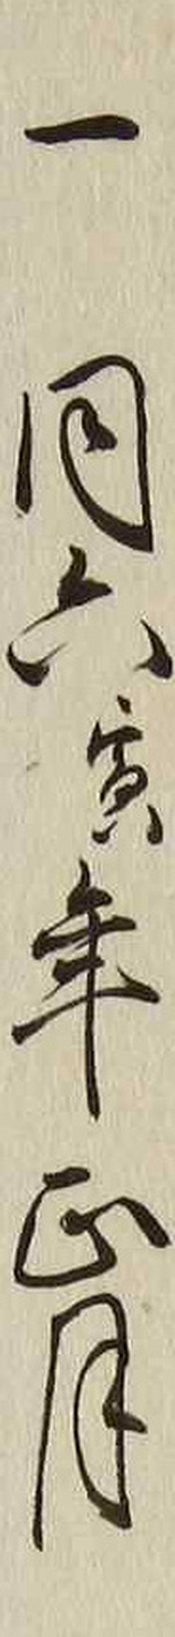一同六寅年正月
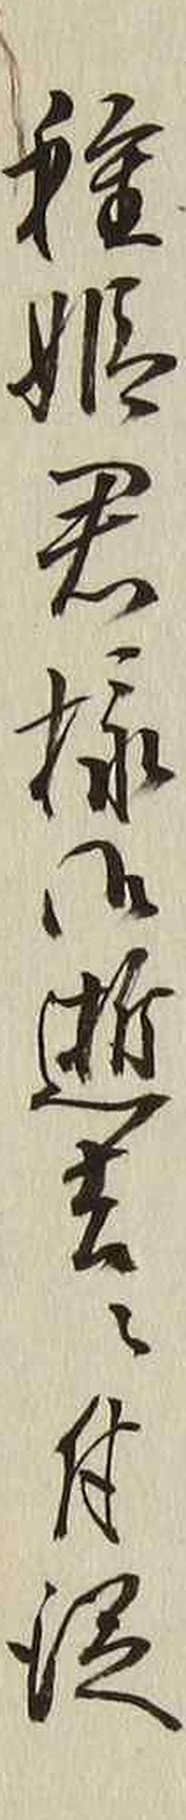種姫君様御逝去ニ付従
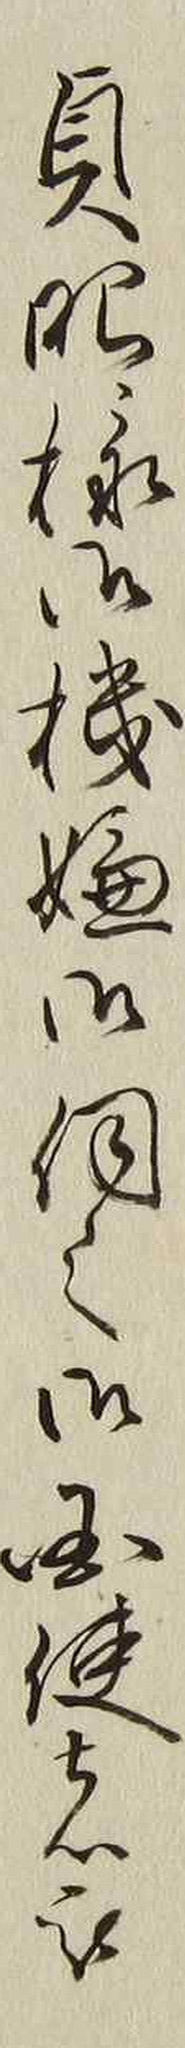貞昭様御機嫌御伺之御国使者被
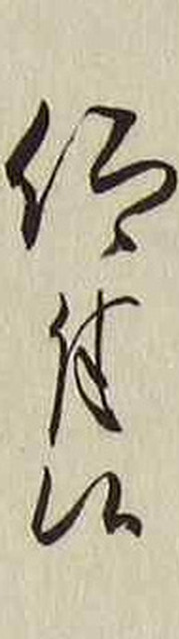仰付候
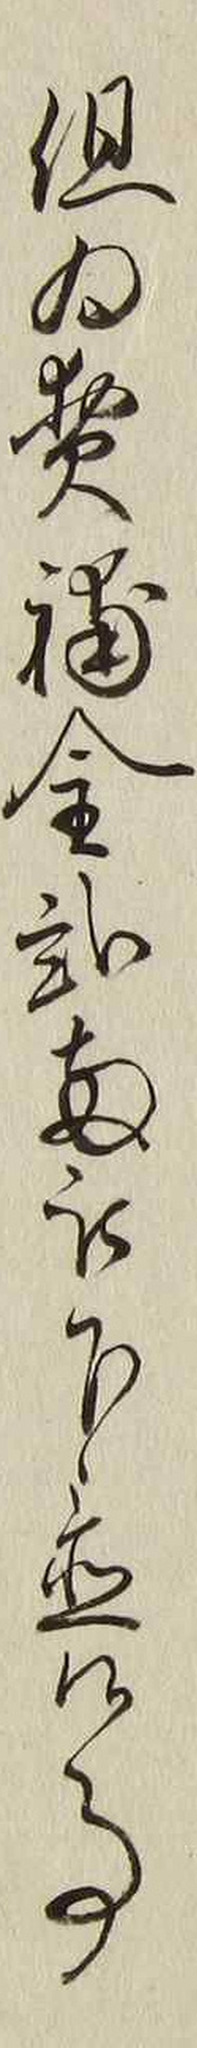但為費補金弐両被下置候事
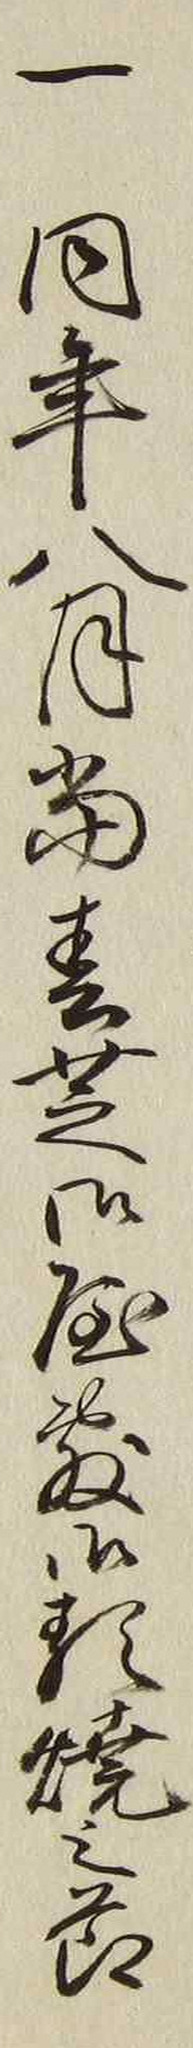一同年八月当春芝御屋敷御類焼之節
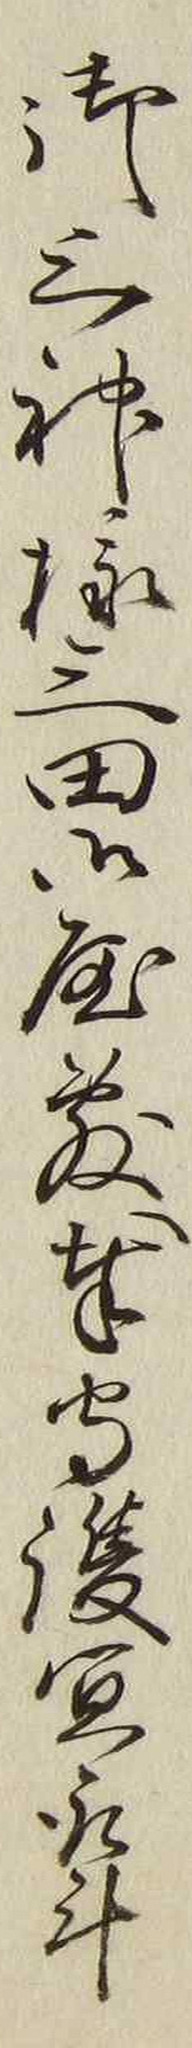御三神様三田御屋敷へ奉守護宜取斗
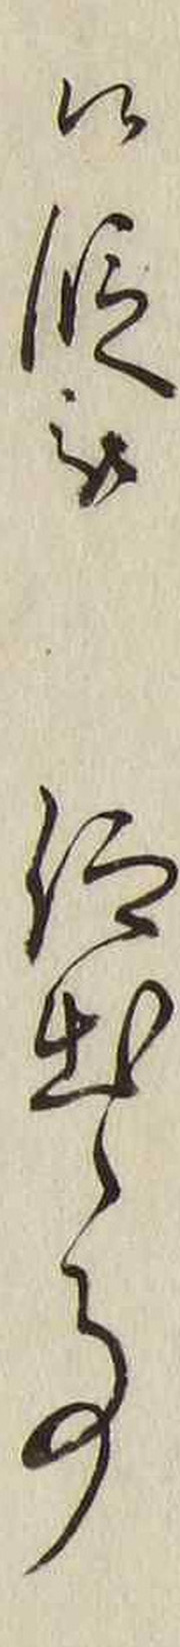候段被仰出候事

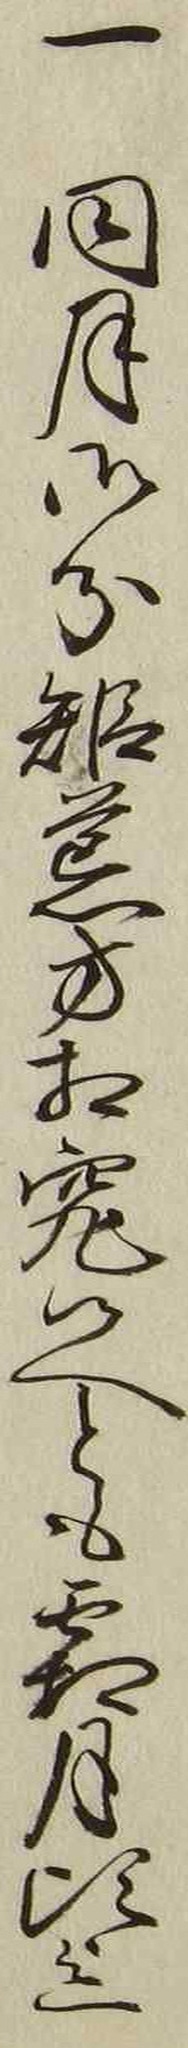一同月御分矩荒方相究候へとも霜月頃迄
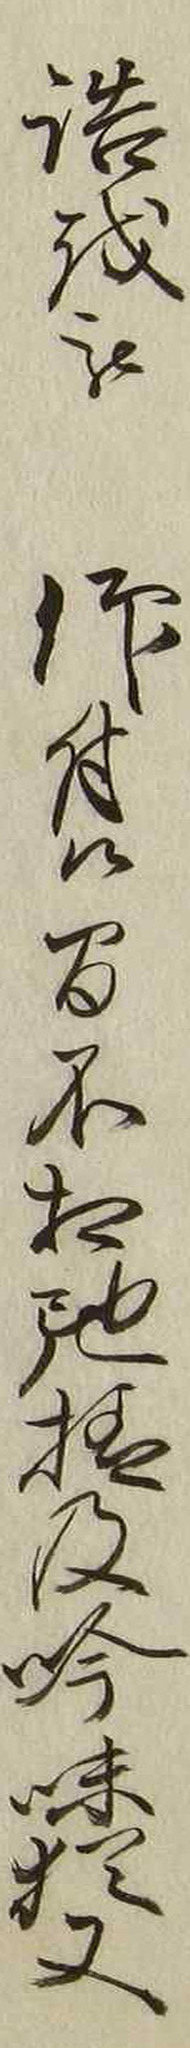詰越被仰付候間不相弛様及吟味猶又
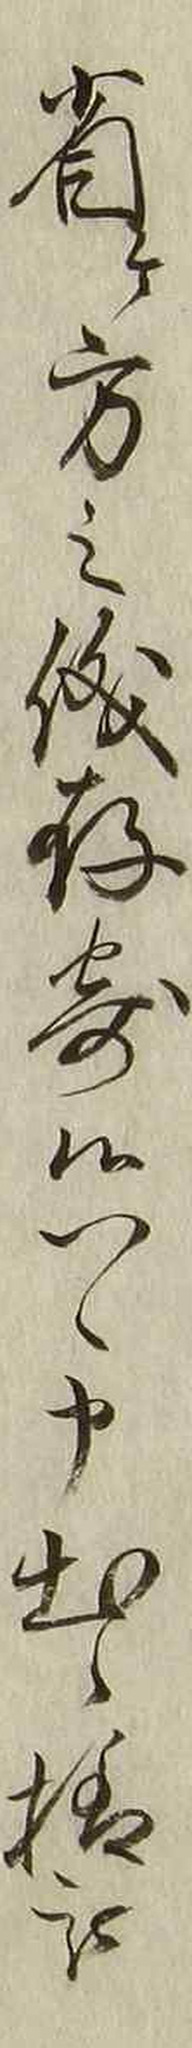省ケ方之儀存寄候ハヽ申出候様被
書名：諸士系譜　巻之21　い之部21
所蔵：会津若松市立会津図書館
